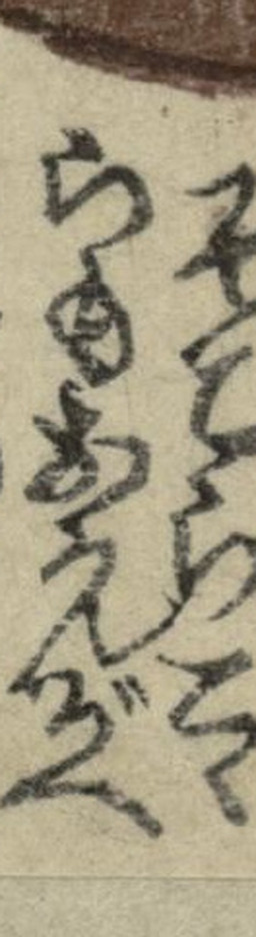らもおかんがへ
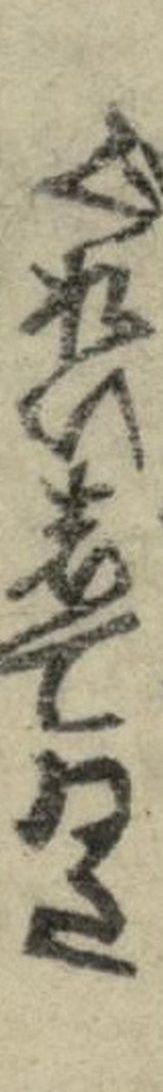ぐれいしてゐた
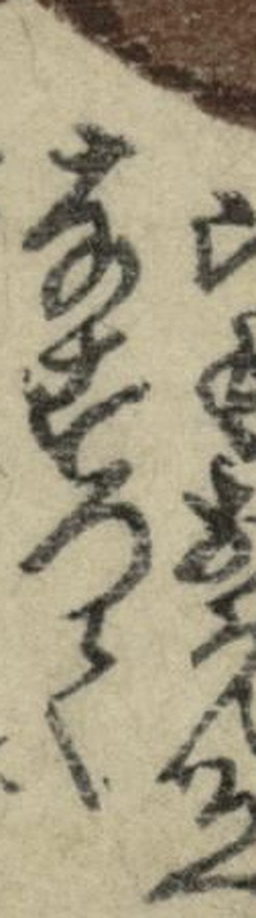なすつて
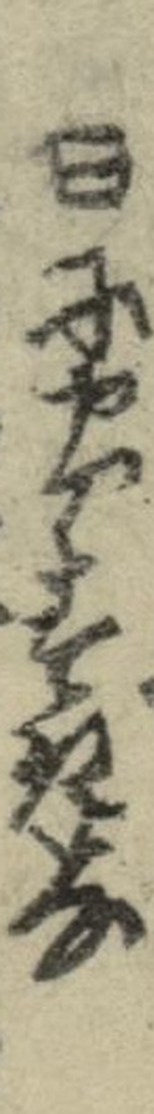日にヤアすきな
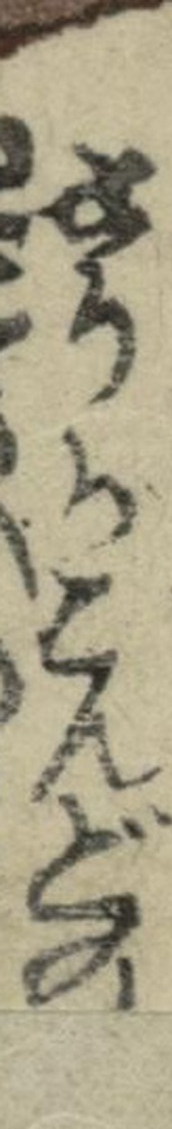どうかこんどの
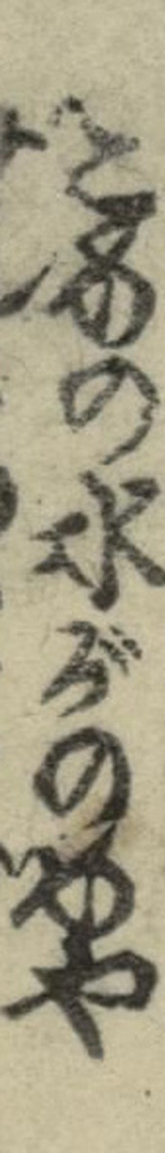とねの水がのめや
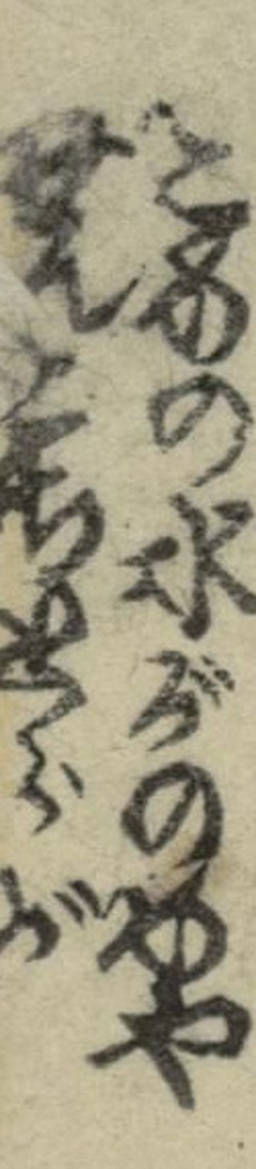せんこちとらが
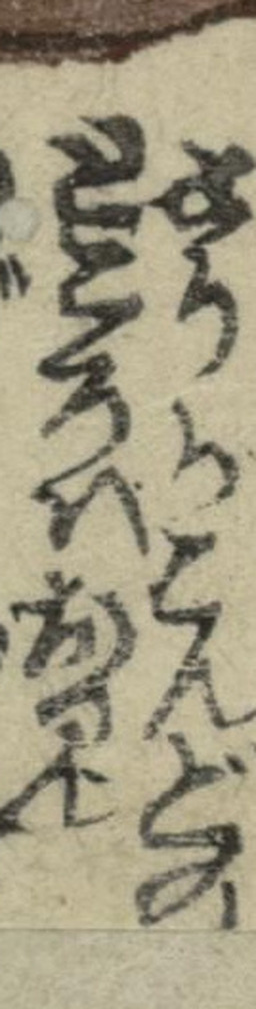ところはおみ
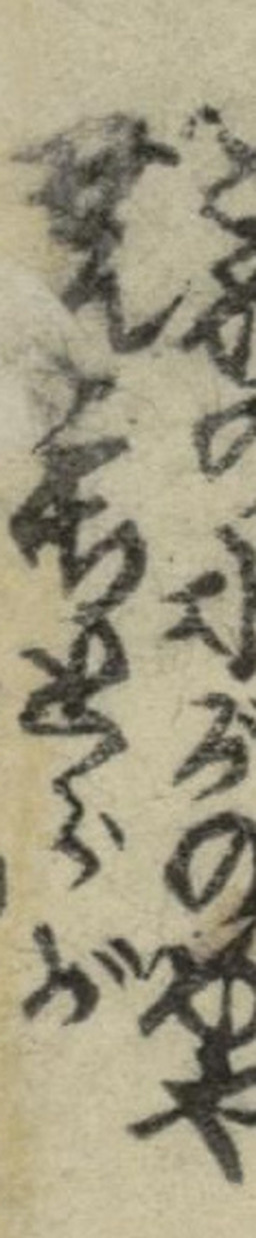せんこちとらが
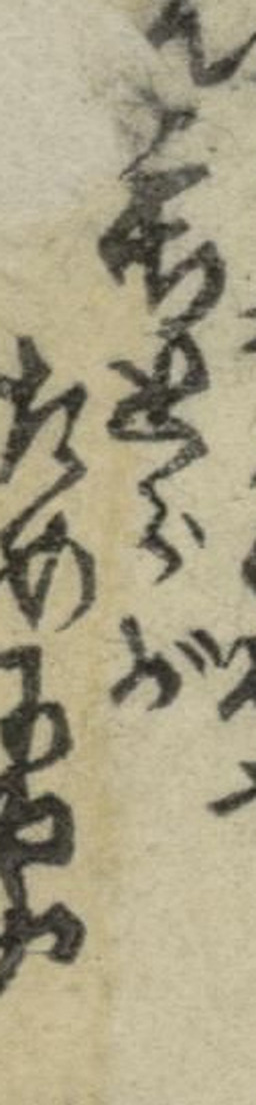ためにやア
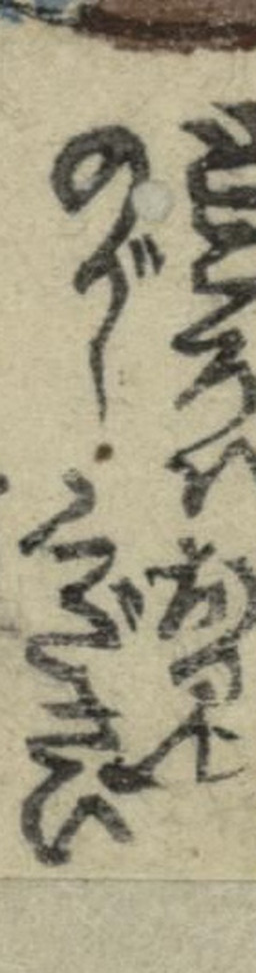のがしくださひ
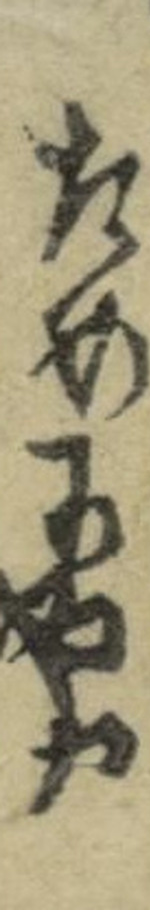ためにやア
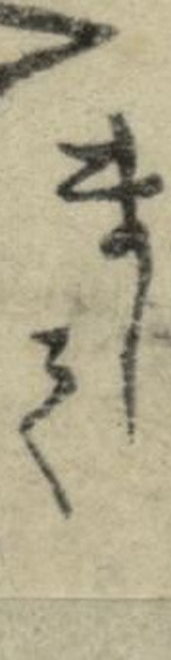まして
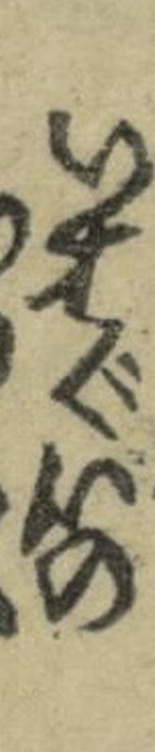いはばいの
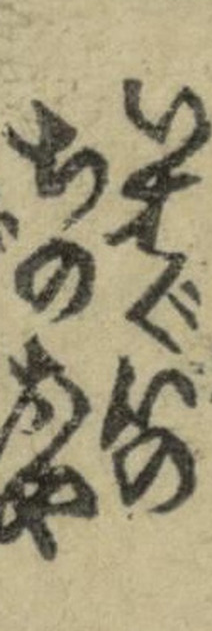ちのおや
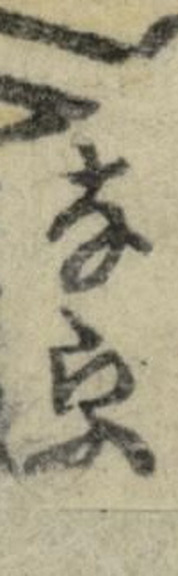ならふ
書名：生捕ました三度の大地震
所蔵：東京大学地震研究所図書室 Earthquake Research Institute Library, The University of Tokyo, JAPAN
